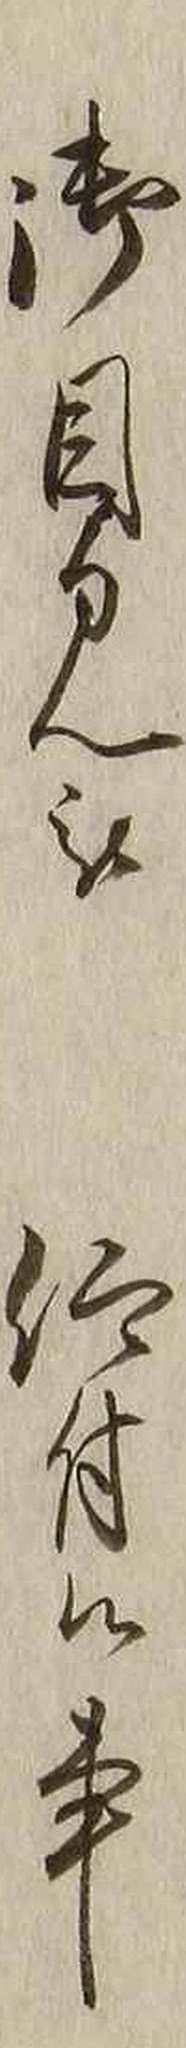御目見被仰付候事
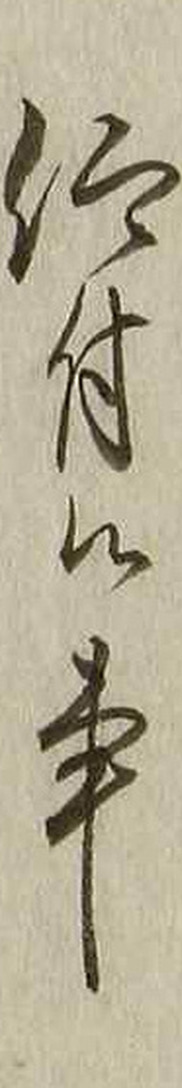仰付候事
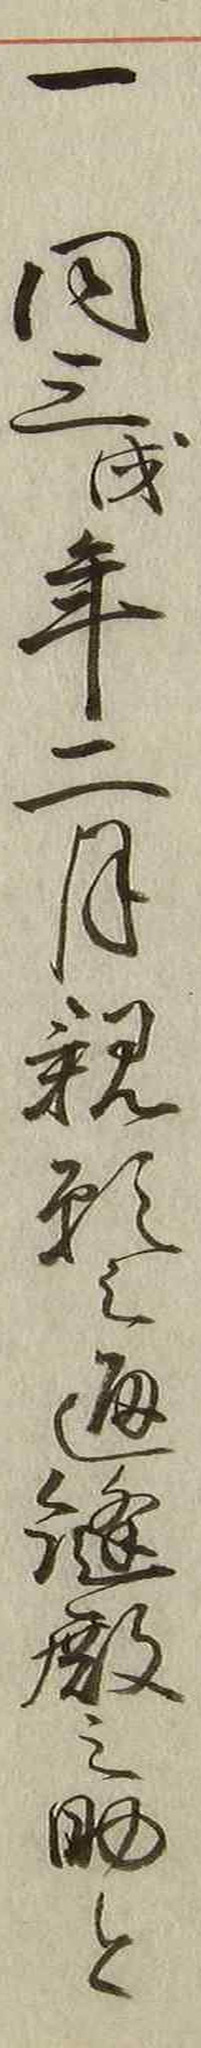一同三戌年二月親願之通縫殿之助と
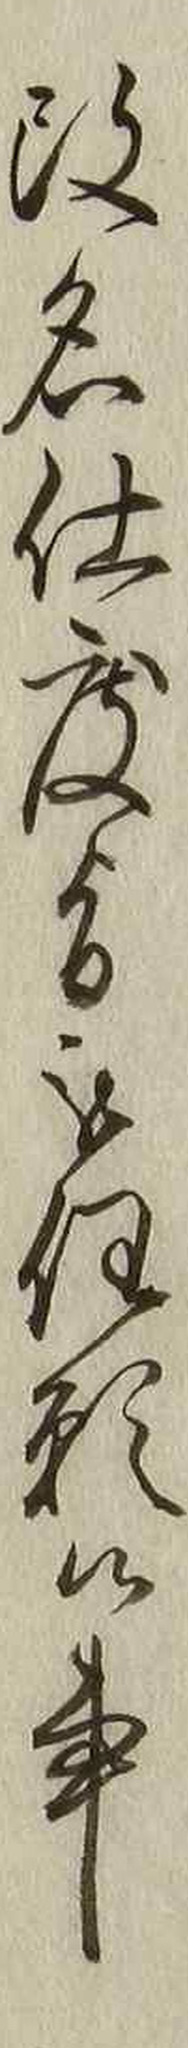改名仕度旨被任願候事
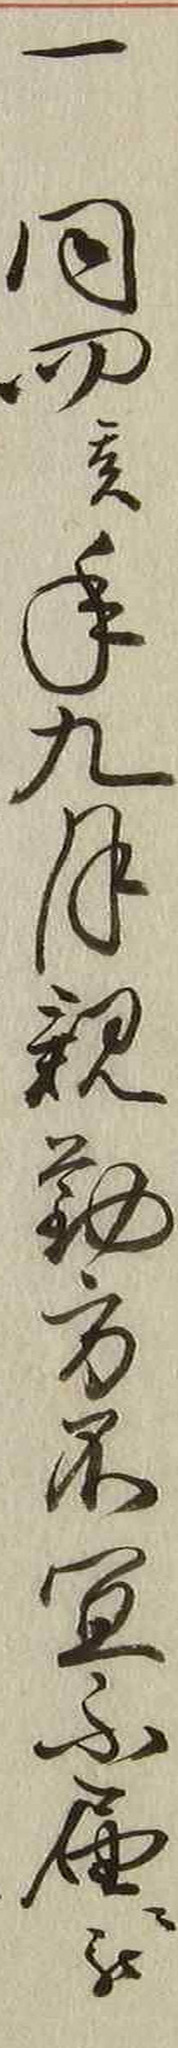一同四亥年九月親勤方不宜不届ニ被
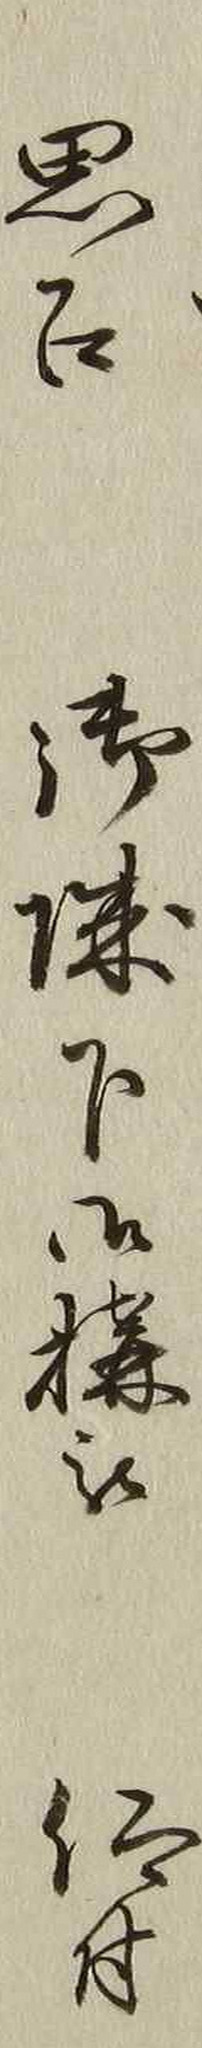思召御城下御構被仰付
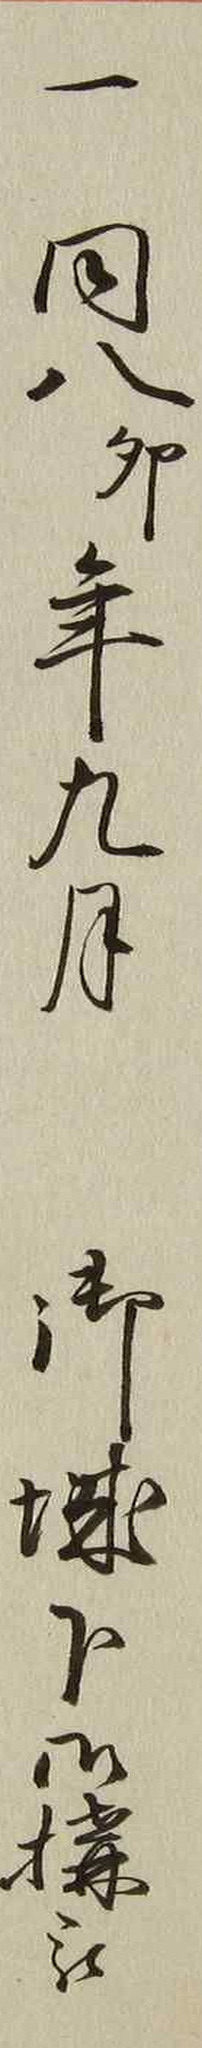一同八卯年九月御城下御構被
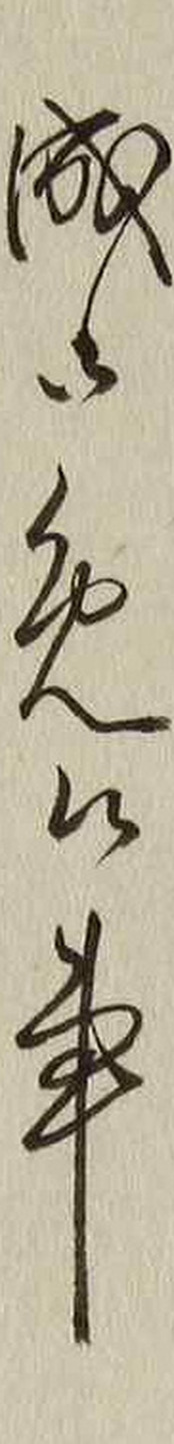成御免候事
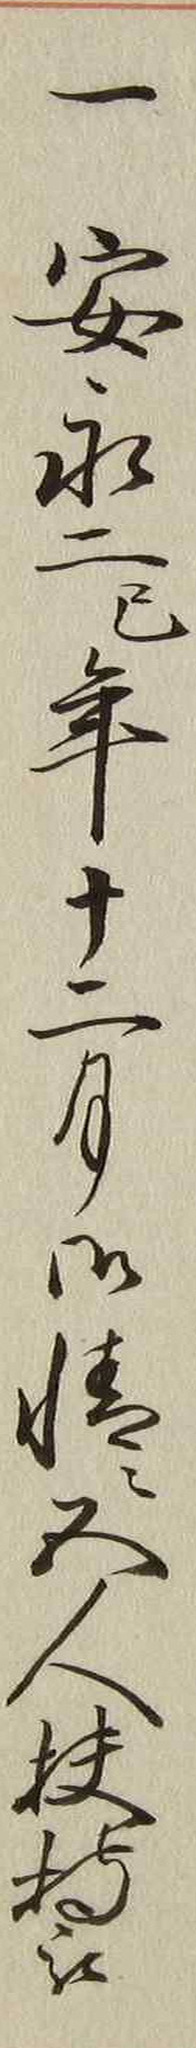一安永二巳年十二月御情ニ五人扶持被
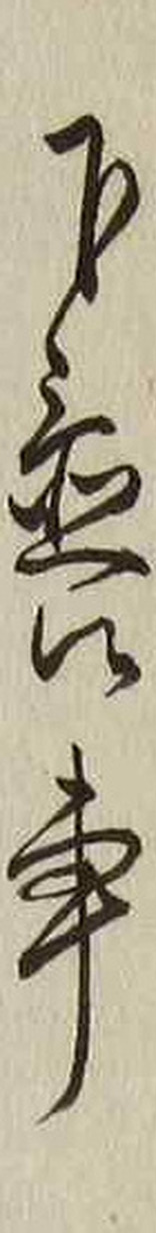下置候事
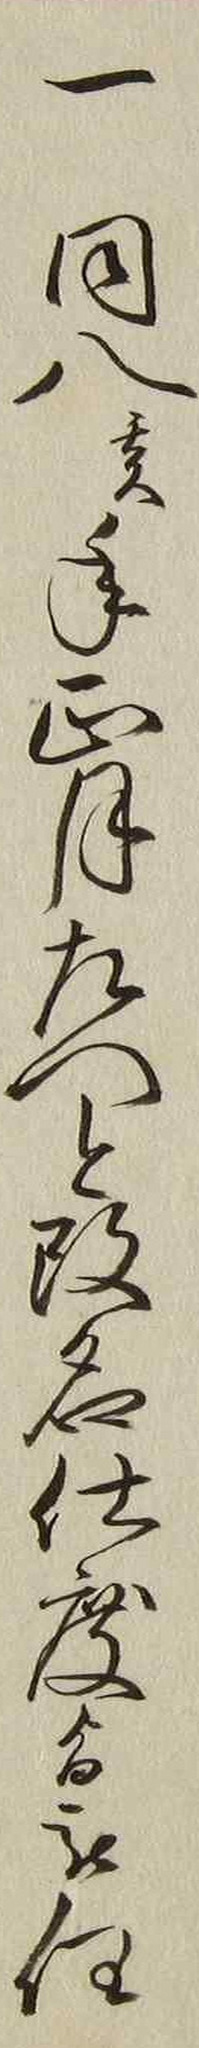一同八亥年正月左門と改名仕度旨被任
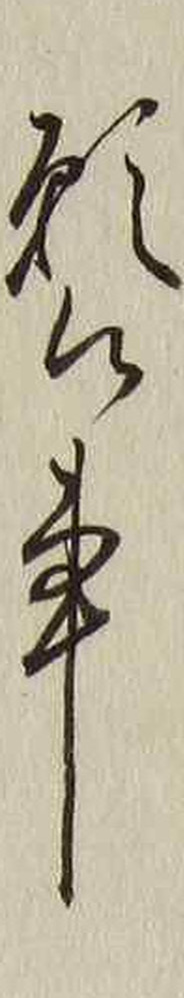願候事
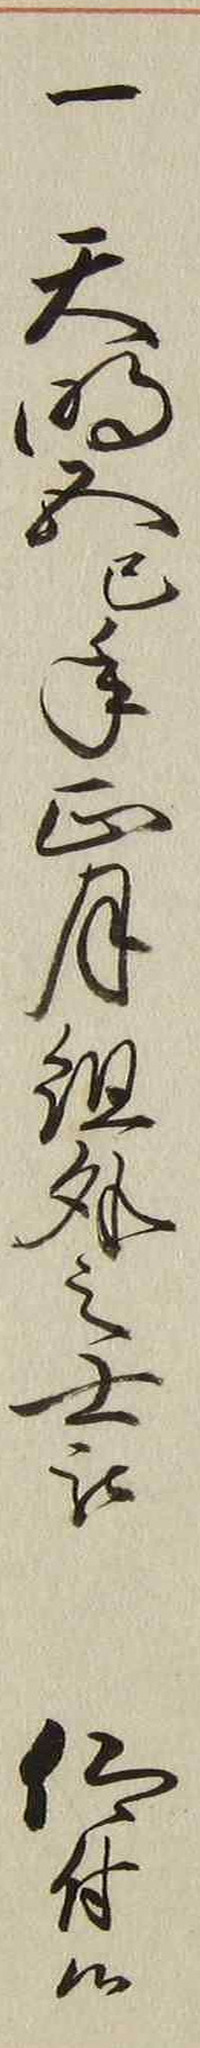一天明五巳年正月組外之士被仰付侯
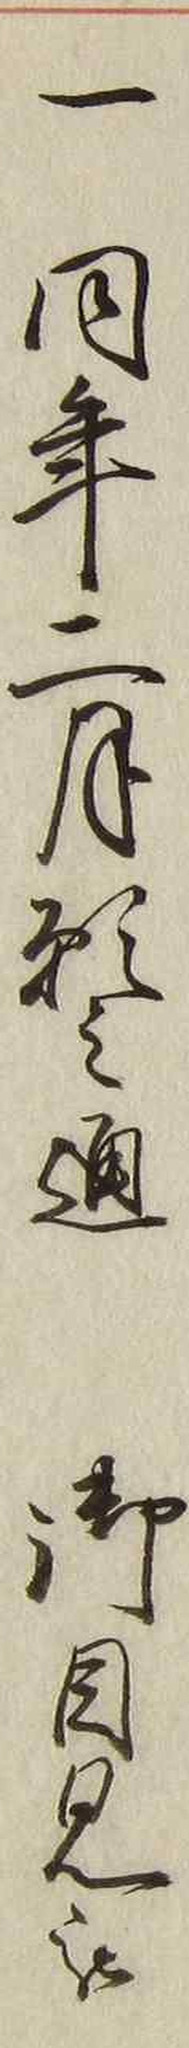一同年二月願之通御目見被
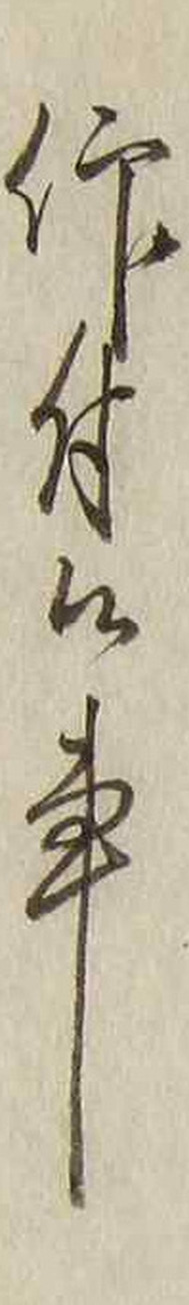仰付候事

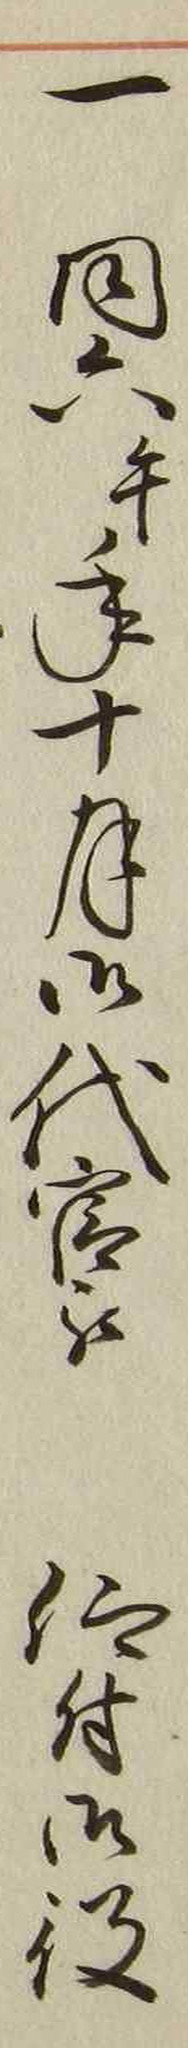一同六午年十月御代官被仰付御役
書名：諸士系譜　巻之21　い之部21
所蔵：会津若松市立会津図書館
